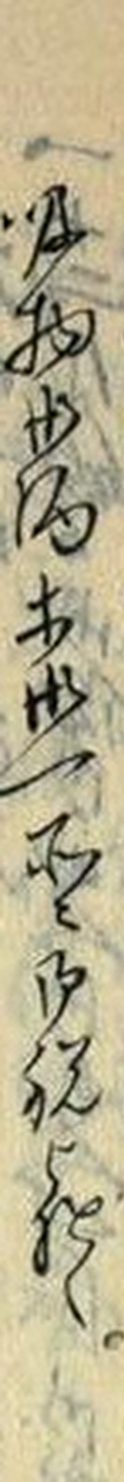吸物御酒等御一所ニ御祝被遊候
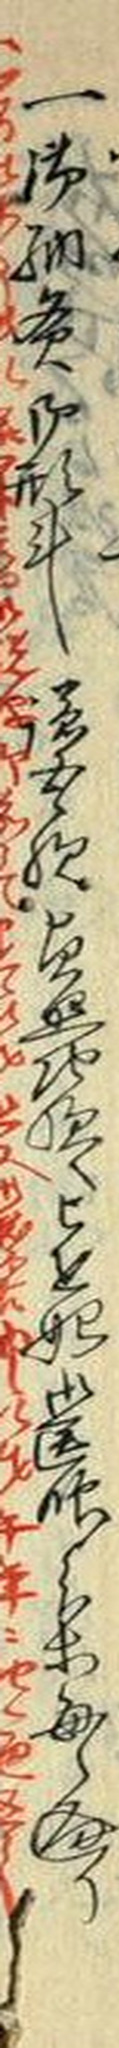一御納灸御形斗謙五郎様貞照院様へ被進始御医師被下等毎之通り
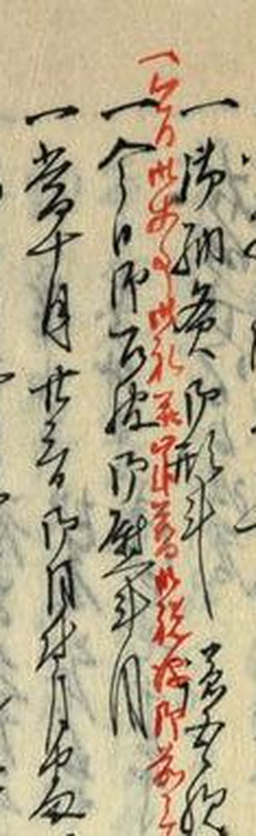一今日御召服御熨斗目
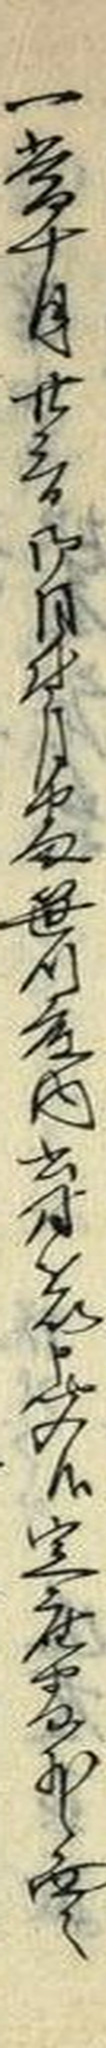一当十月廿三日御目付月番笹川藤内書付を以申聞候定座番外之面々
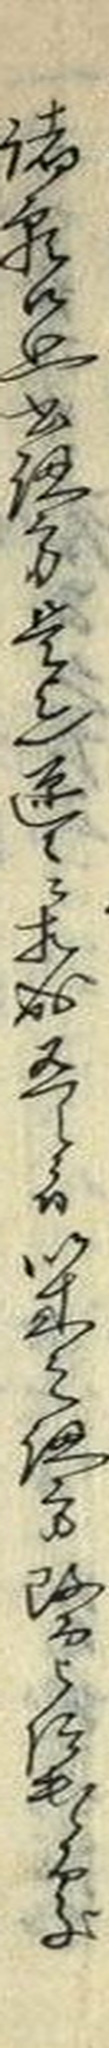諸願口上書認方是迄区々ニ相成有之候ニ付以来之認方改而被仰出候処
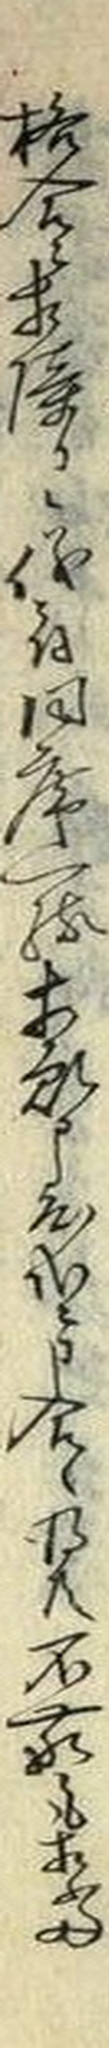格合ニ相障り候儀ニ付同席一統相願申度哉ニ申合候得共不敬ニも相当
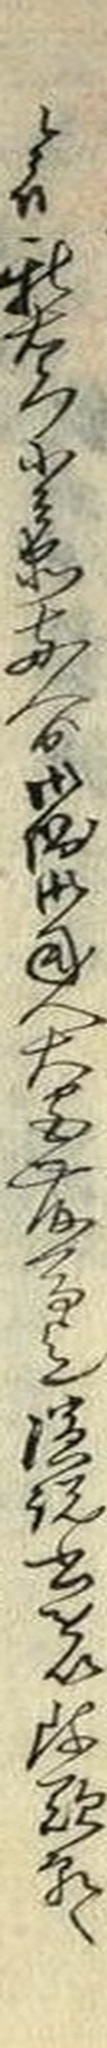候ニ付新右衛門小兵衛両人ゟ御側御用人大宮藤馬迄演説書を以致歎願候
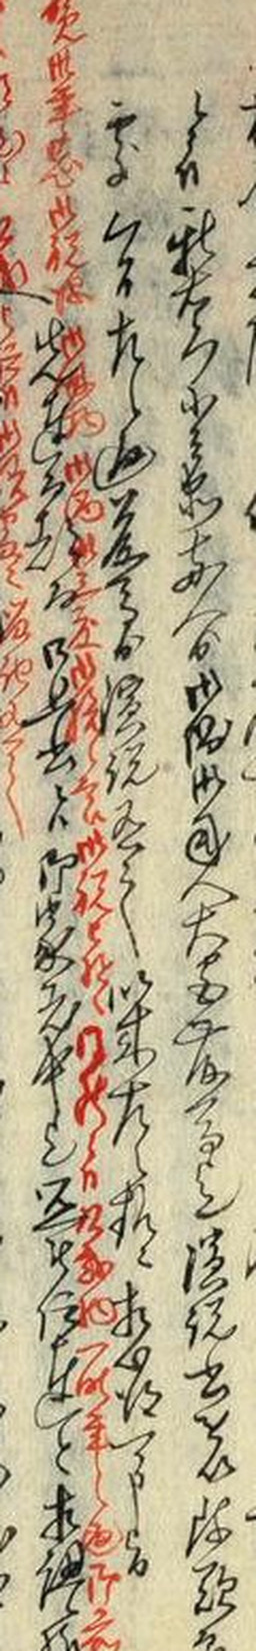処今日左之通藤馬ゟ演説有之以来左之趣ニ相心得可申旨
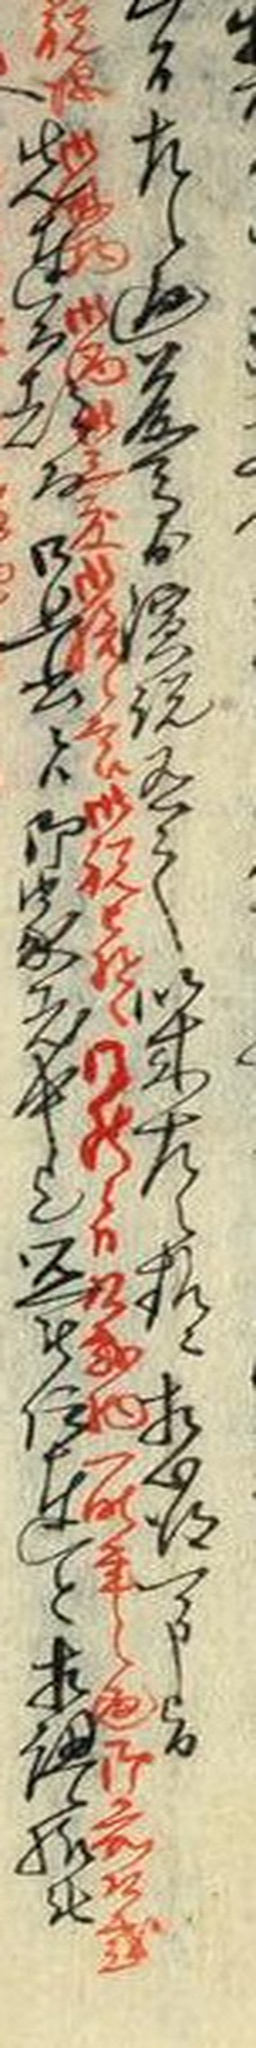先達而都而口上書ニハ御家老中迄宜被仰達と相認候様被
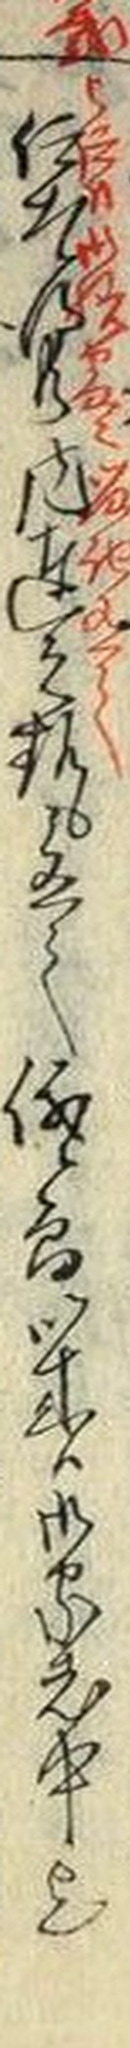仰出候得共内達之趣も有之儀ニ候間以来ハ御家老中迄
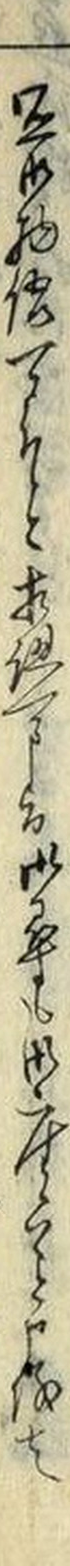宜御物語可被下候と相認可申旨御尋も御座候ハヽと申儀者
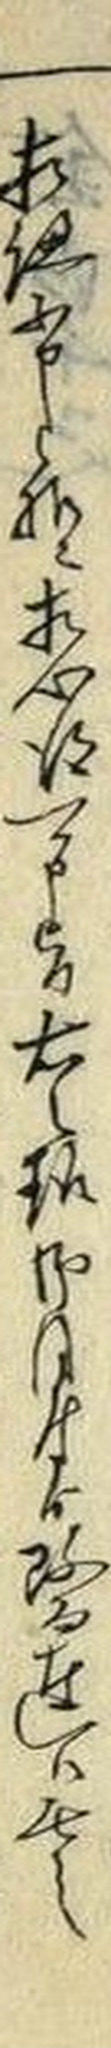相認不申候様ニ相心得可申旨右之趣御目付ゟ改而達ハ無之
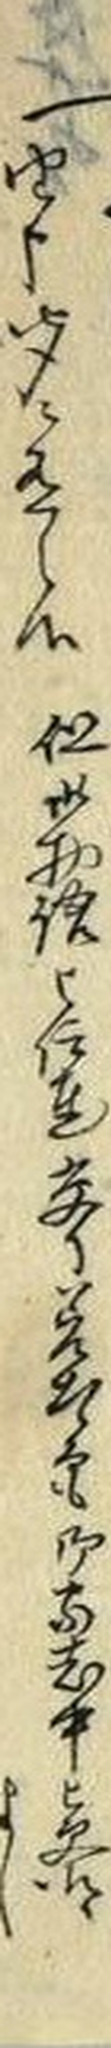由申聞ニ有之候但御物語被仰達交り差出候而も御家老中被受取候よし

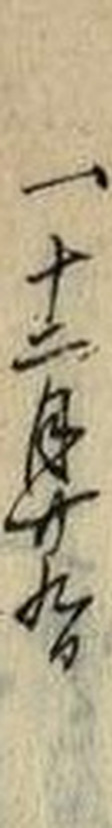一十二月廿九日
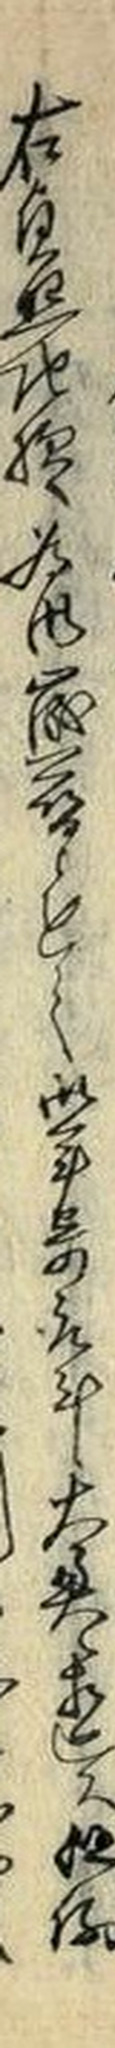右貞照院様へ為御歳暮被進之御年寄取計大奥へ相廻ス但例
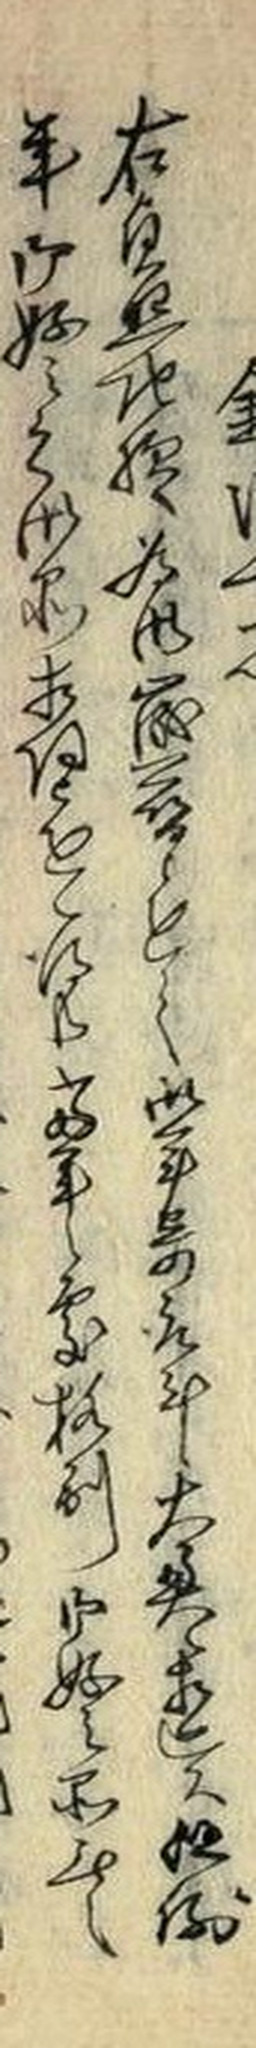年御好み之御品相伺被進候得共当年之処格別御好み品無之
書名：少傅日録抄（斉承付側向頭取日記、在国）
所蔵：福井県文書館 Fukui Prefectural Archives
